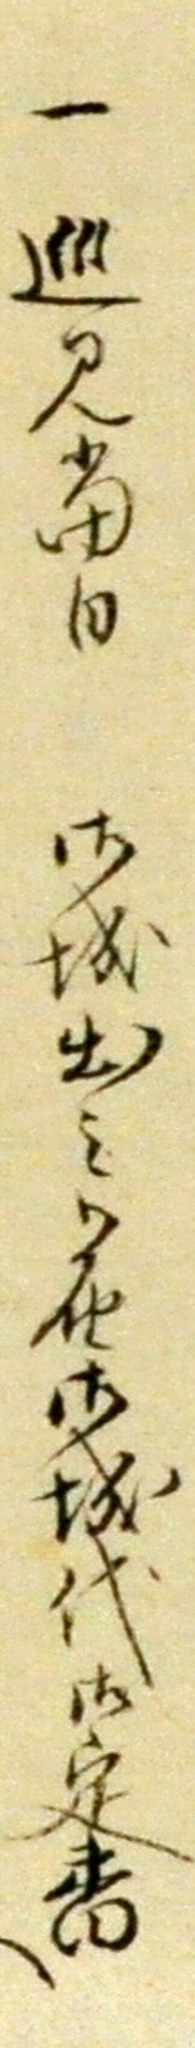一巡見当日御城出之御届御城代御定番へ
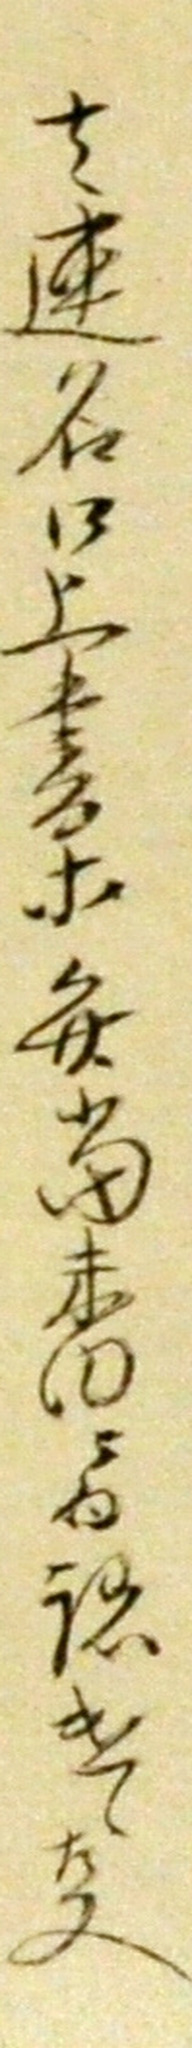は連名口上書等弁当番に而認遣候事
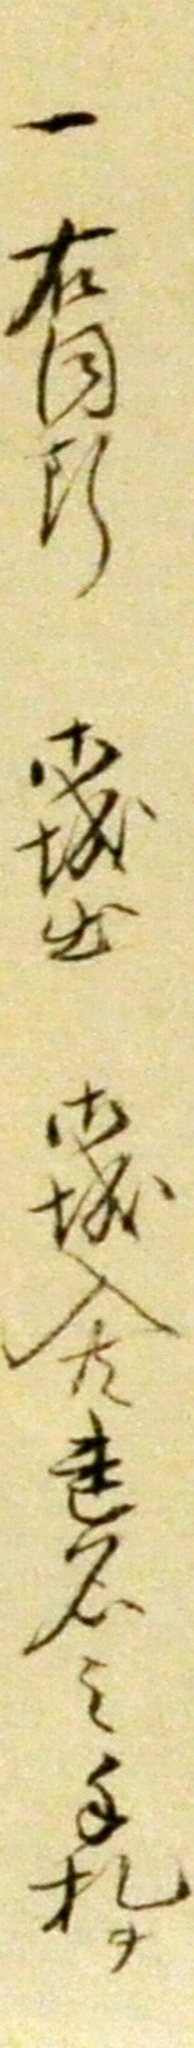一右同断御城出御城入共連名之手札ヲ
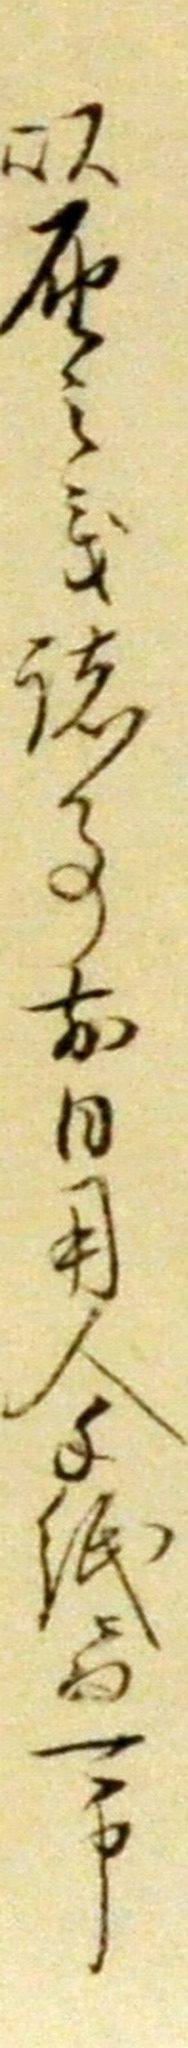以届之義諸事前日用人手紙に而可申
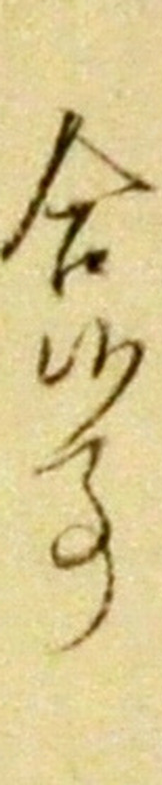合候事
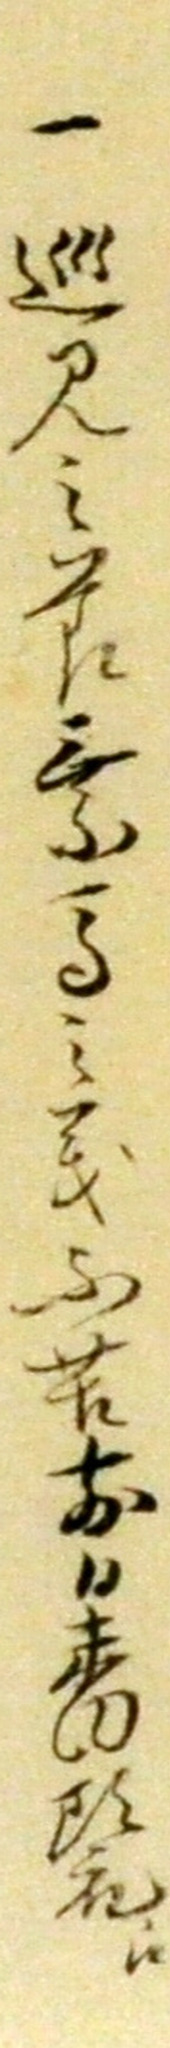一巡見之節乗馬之義不苦前日番頭衆え
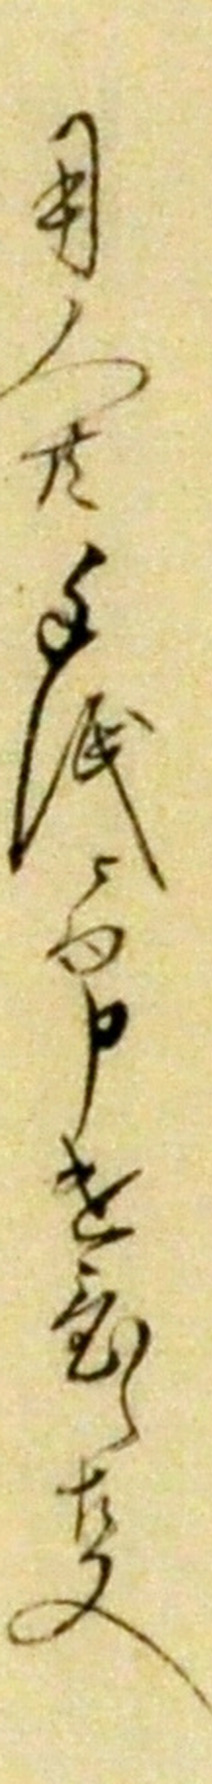用人共手紙に而申遣置候事
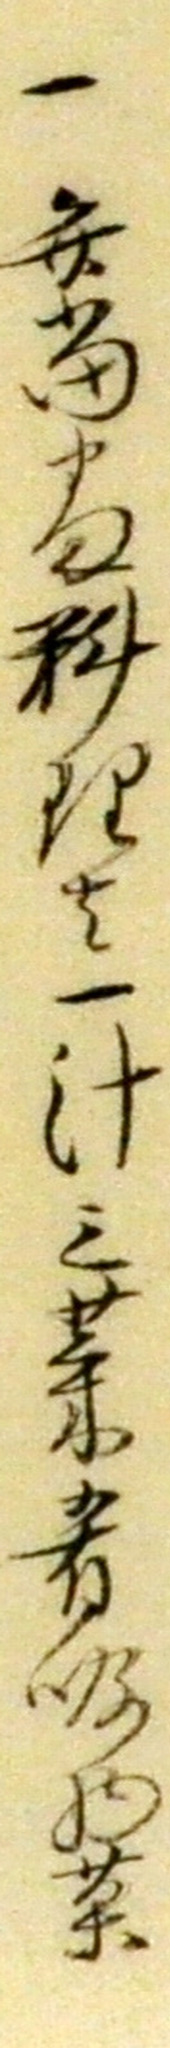一弁当番料理は一汁三菜肴吸物菓
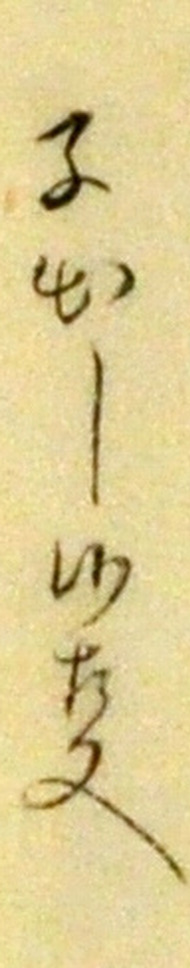子出し候事
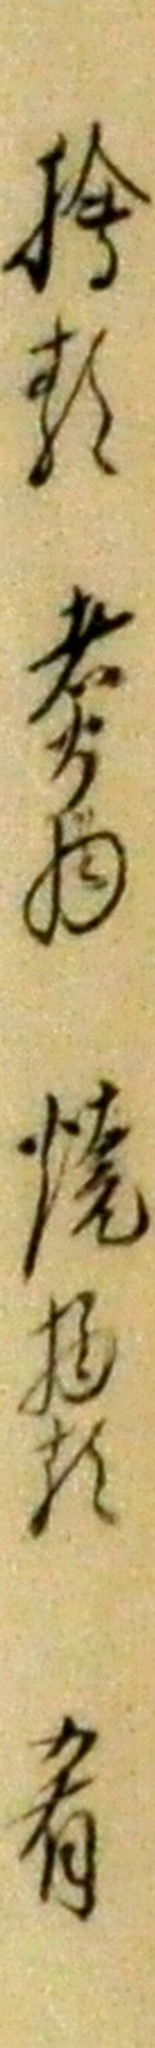膾類煮物焼物類肴
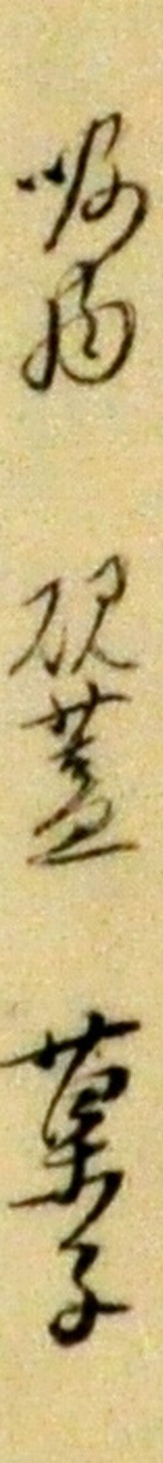吸物硯蓋菓子
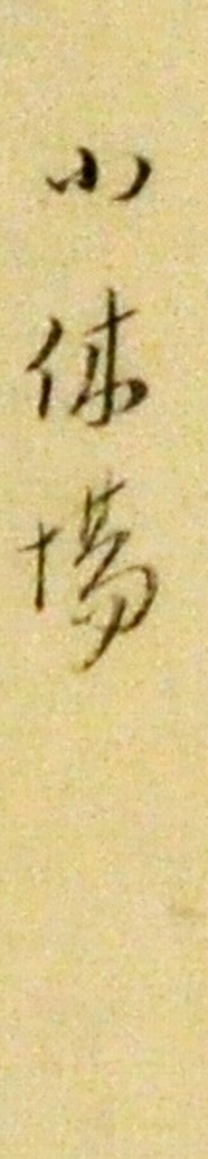小休場
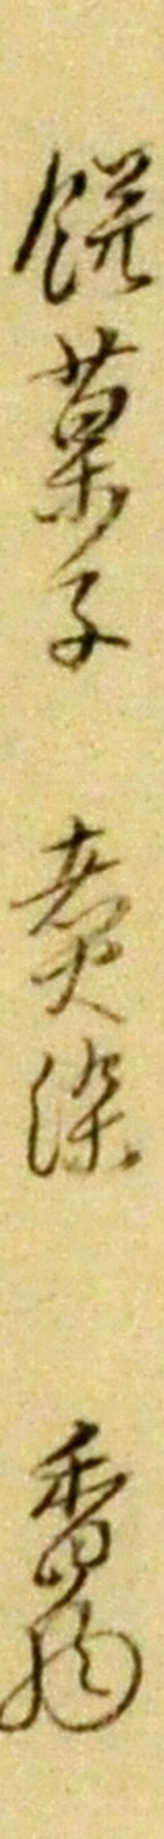餅菓子煮染香物
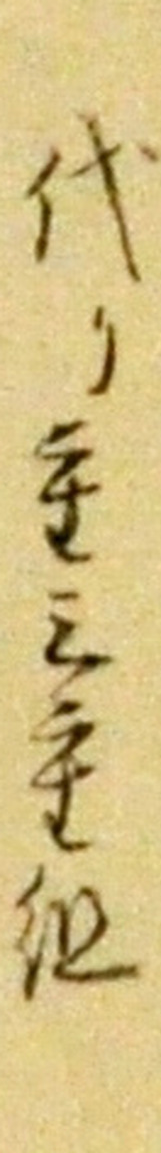代り重三重組
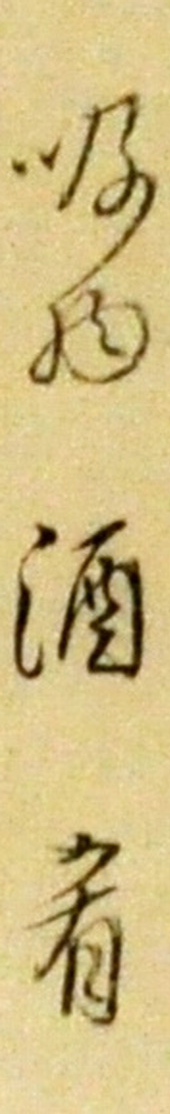吸物酒肴
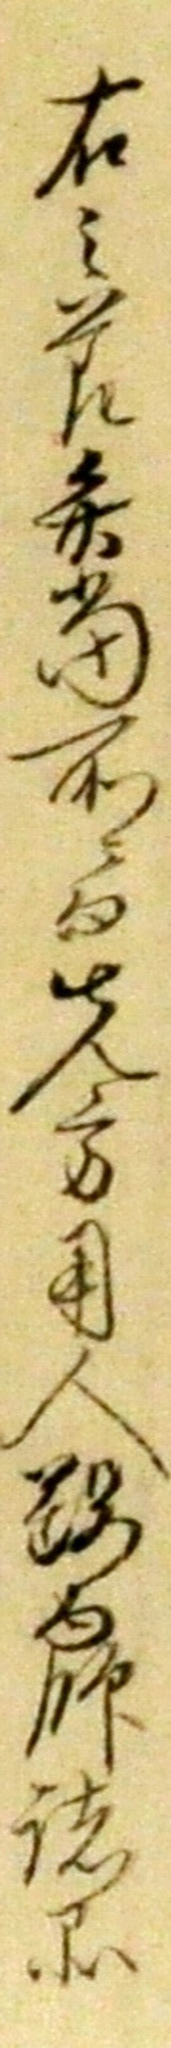右之節弁当所に而先方用人医師諸品
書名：大阪加番関係諸書留〔一括〕
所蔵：伊那市立高遠町図書館・合同会社AMANE
